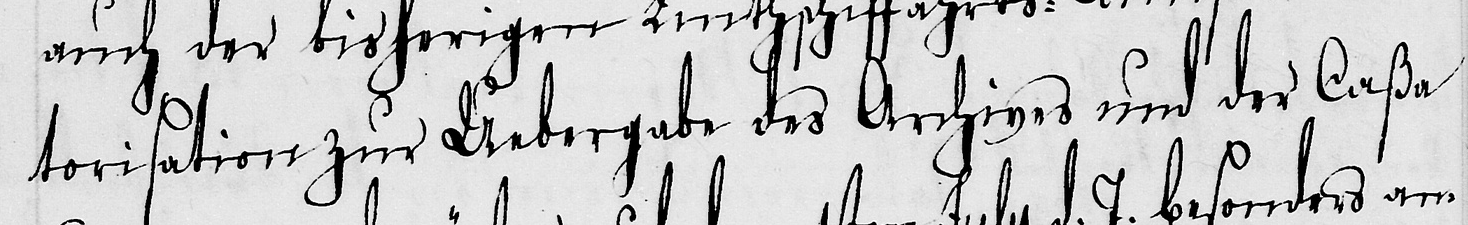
torisation zur Uebergabe des Archives und der Caßa
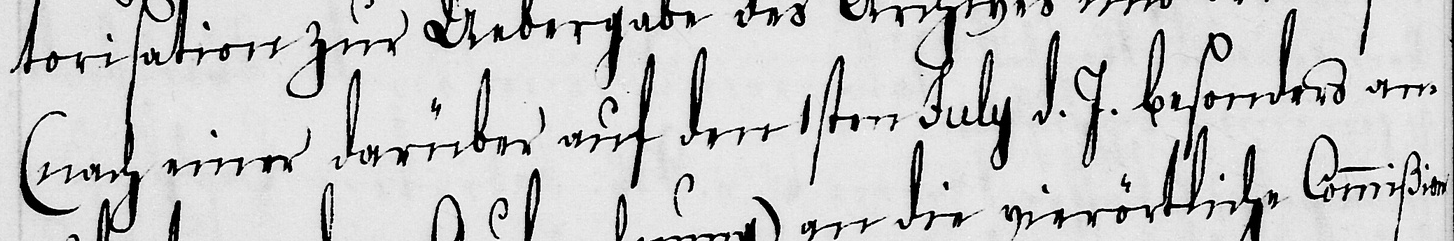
(nach einer darüber auf den 1sten July d. J. besonders an¬
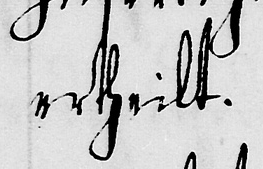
ertheilt.
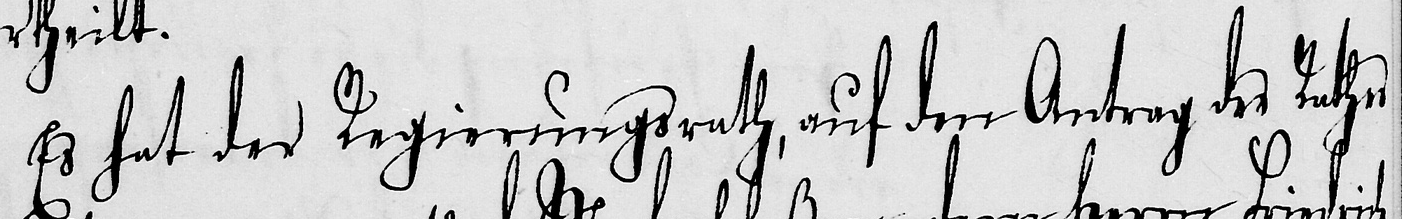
Es hat der Regierungsrath, auf den Antrag des Rath¬
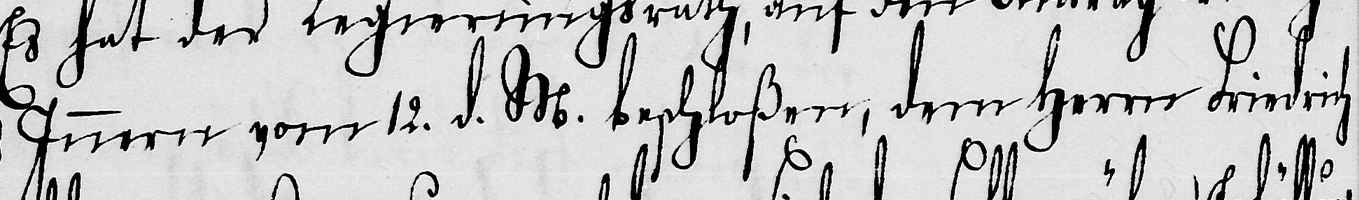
Innern vom 12. d. M. beschloßen, dem Herrn Friedri¬
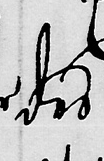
ie¬
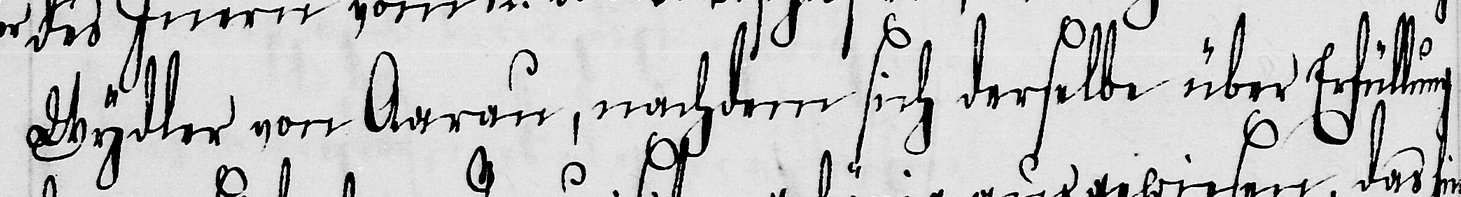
Wydler von Aarau, nachdem sich derselbe über Erfül¬
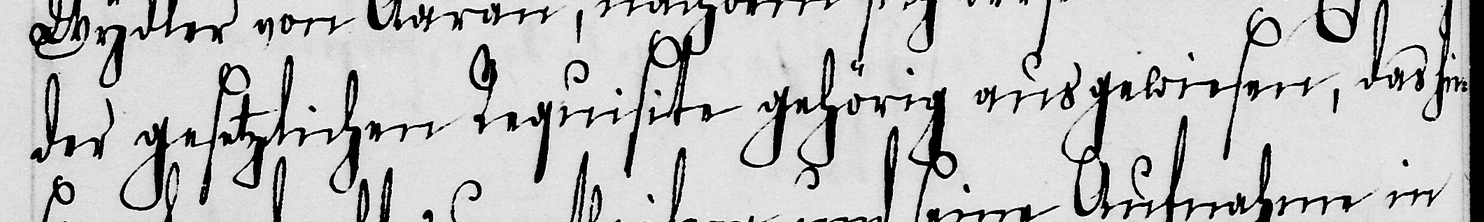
der gesetzlichen Requisite gehörig ausgewiesen, das h¬
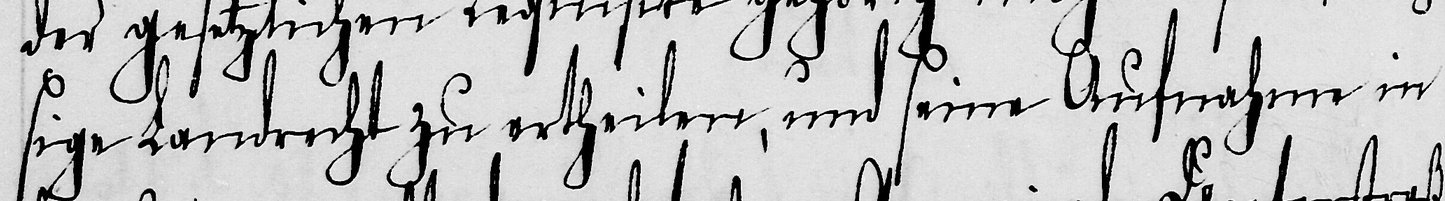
sige Landrecht zu ertheilen, und seine Aufnahme in
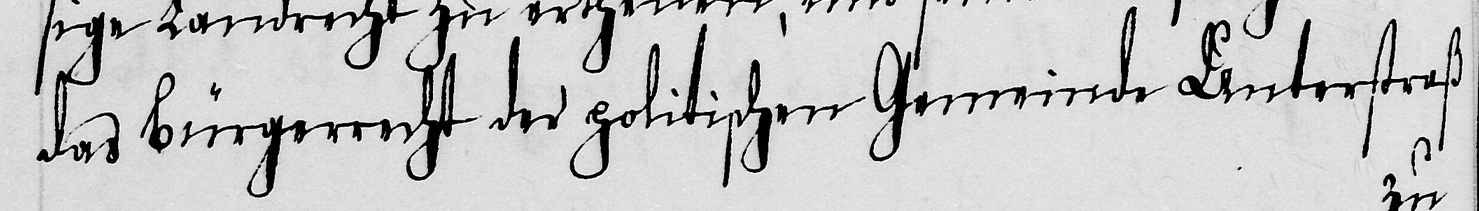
das Bürgerrecht der politischen Gemeinde Unterstraß
